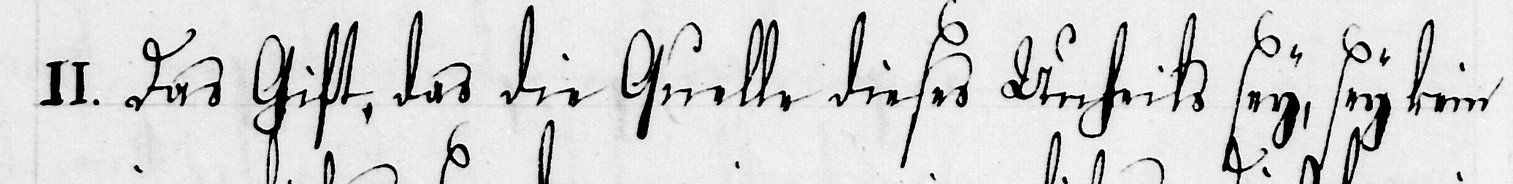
I. Das Gift, das die Quelle dieses Unheils sey, sey kein
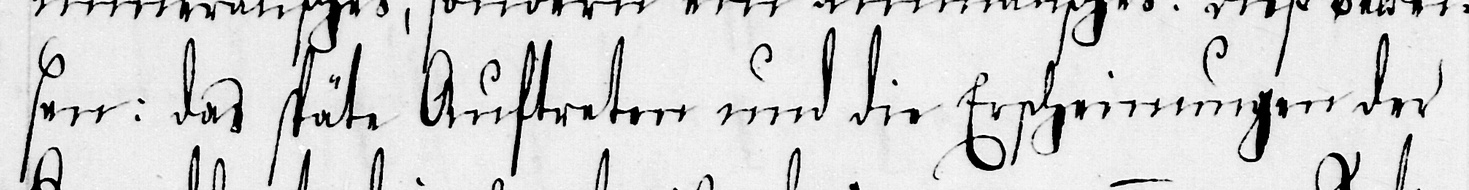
sen: das späte Auftreten und die Erscheinungen der
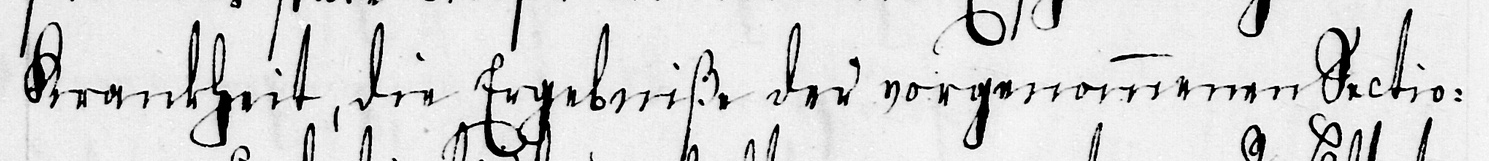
Krankheit, die Ergebniße der vorgenommenen Sectio¬
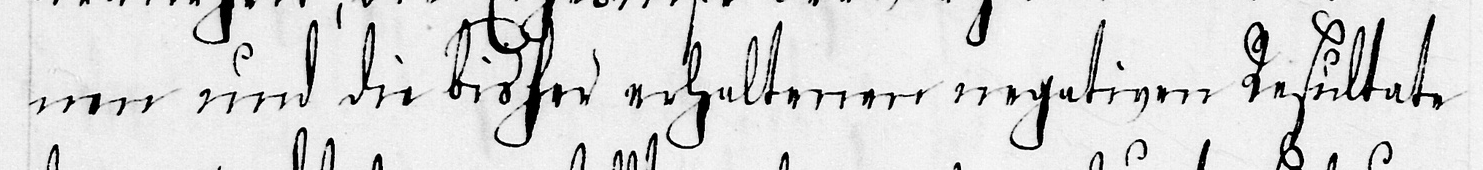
nen und die bisher erhaltenen negativen Resultate
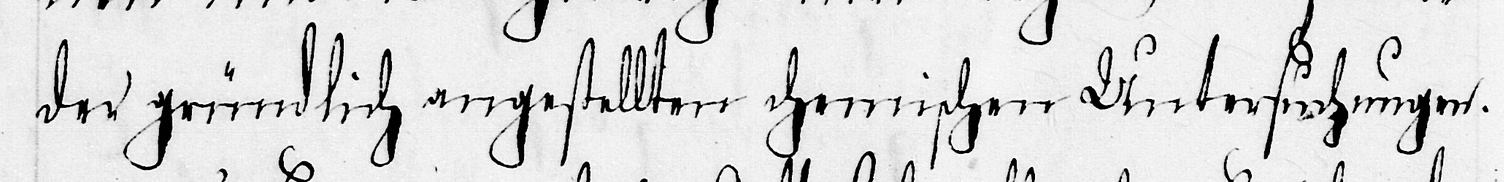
der gründlich angestellten chemischen Untersuchungen.
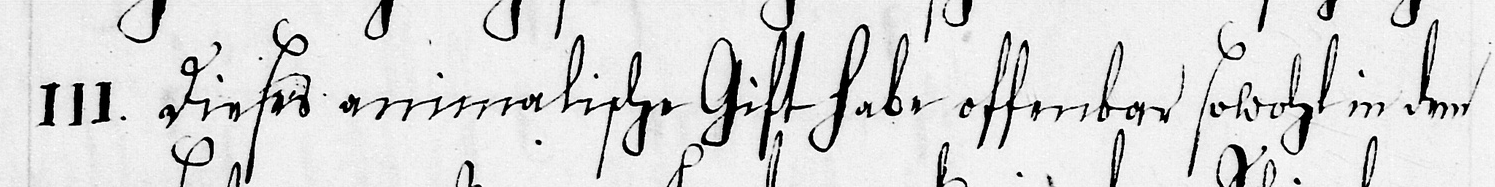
II. Dieses animalische Gift habe offenbar sowohl in dem
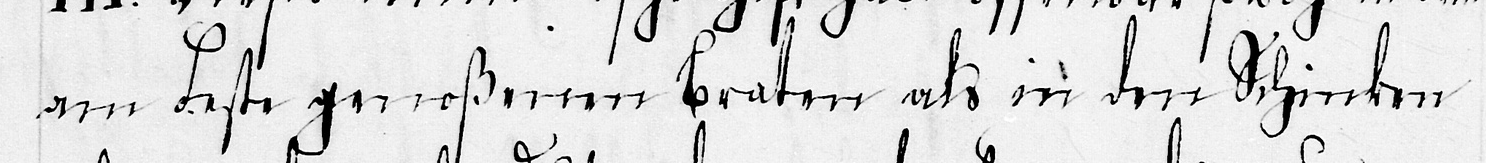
am Feste genoßenen Braten als in den Schinken
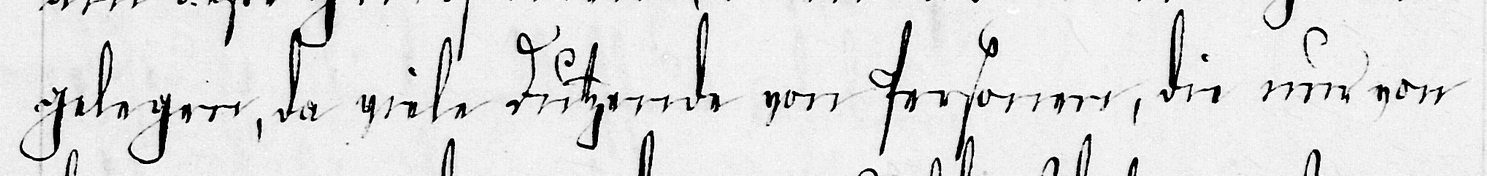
gelegen, da viele Dutzende von Personen, die nur von
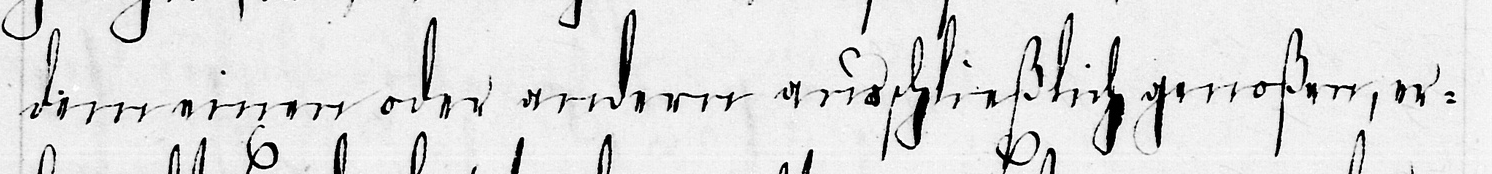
dem einen oder andern ausschließlich genoßen, er¬
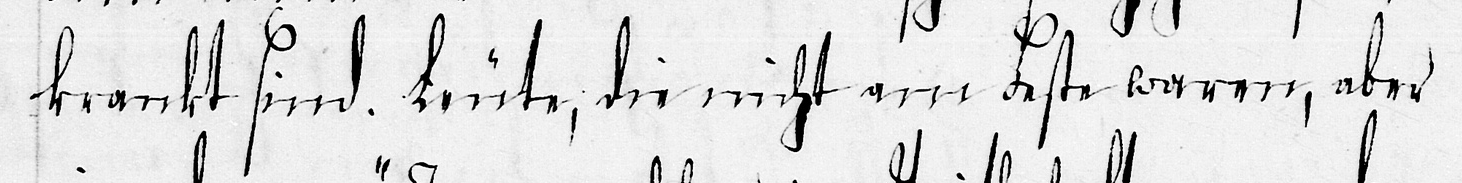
krankt sind. Leute, die nicht am Feste waren, aber
